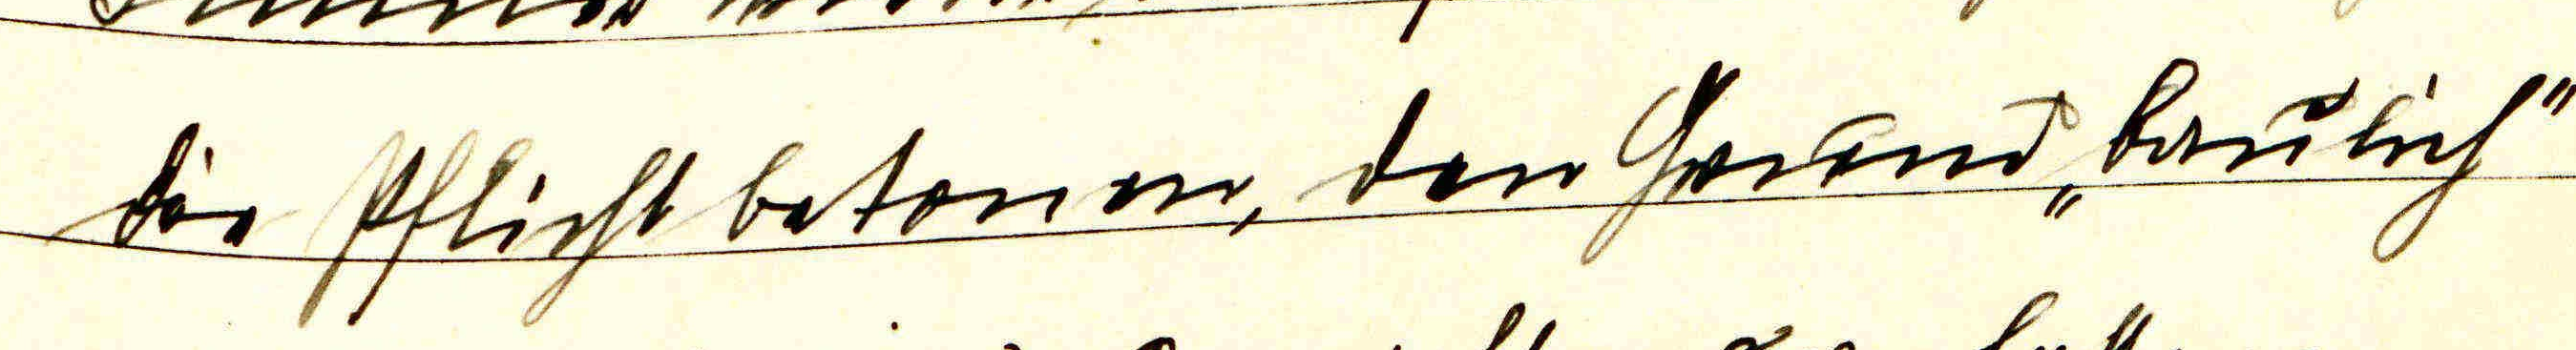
die Pflicht betonen, den Grund "baulich"
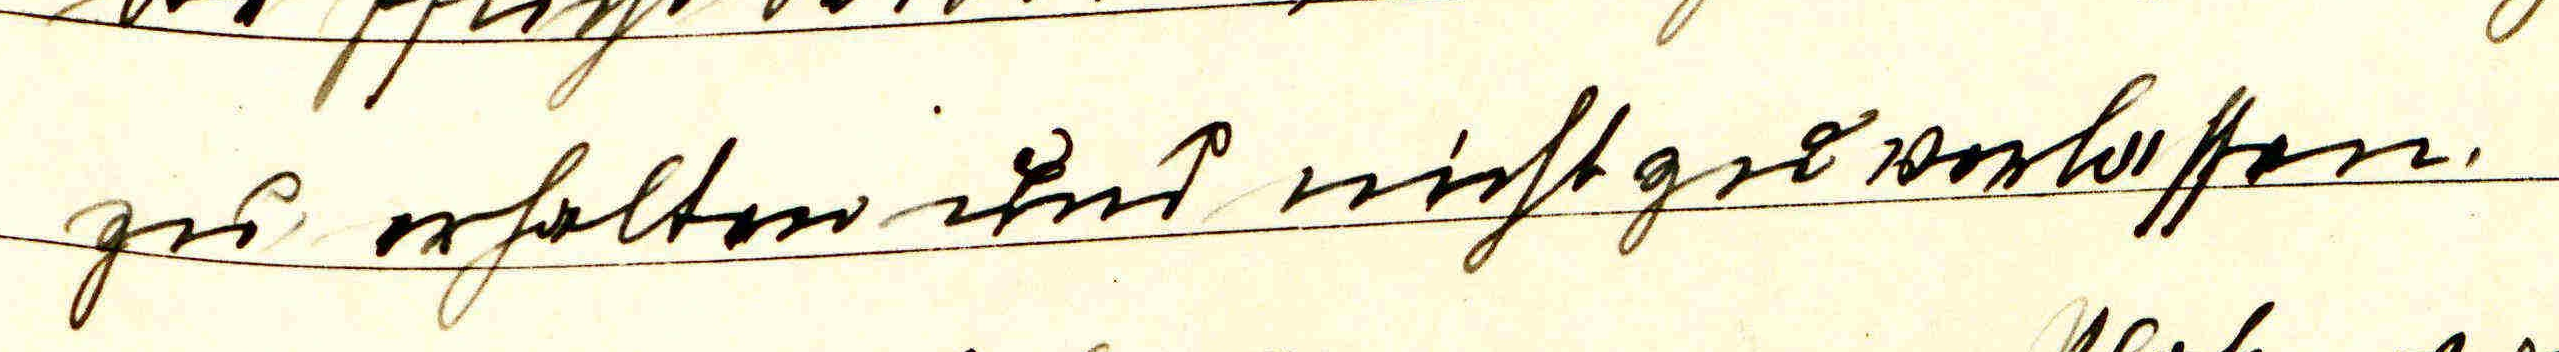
zu erhalten und nicht zu verlassen.
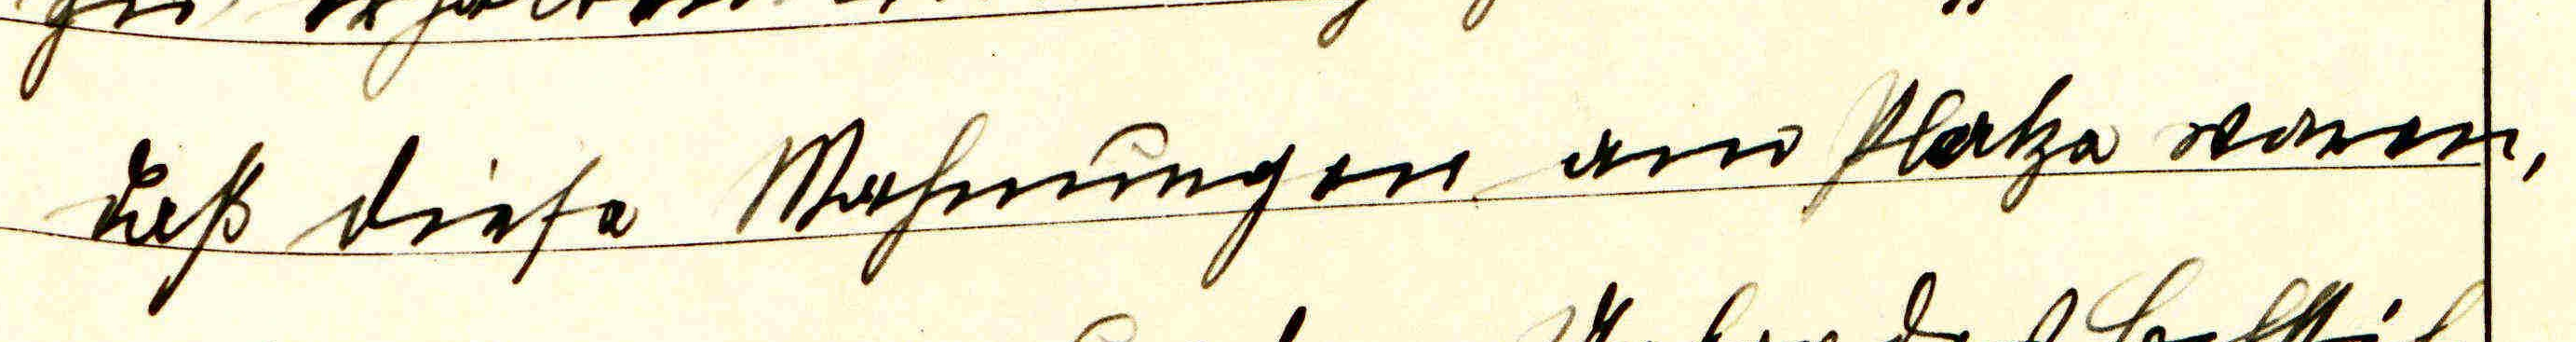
Daß diese Mahnungen am Platza waren,
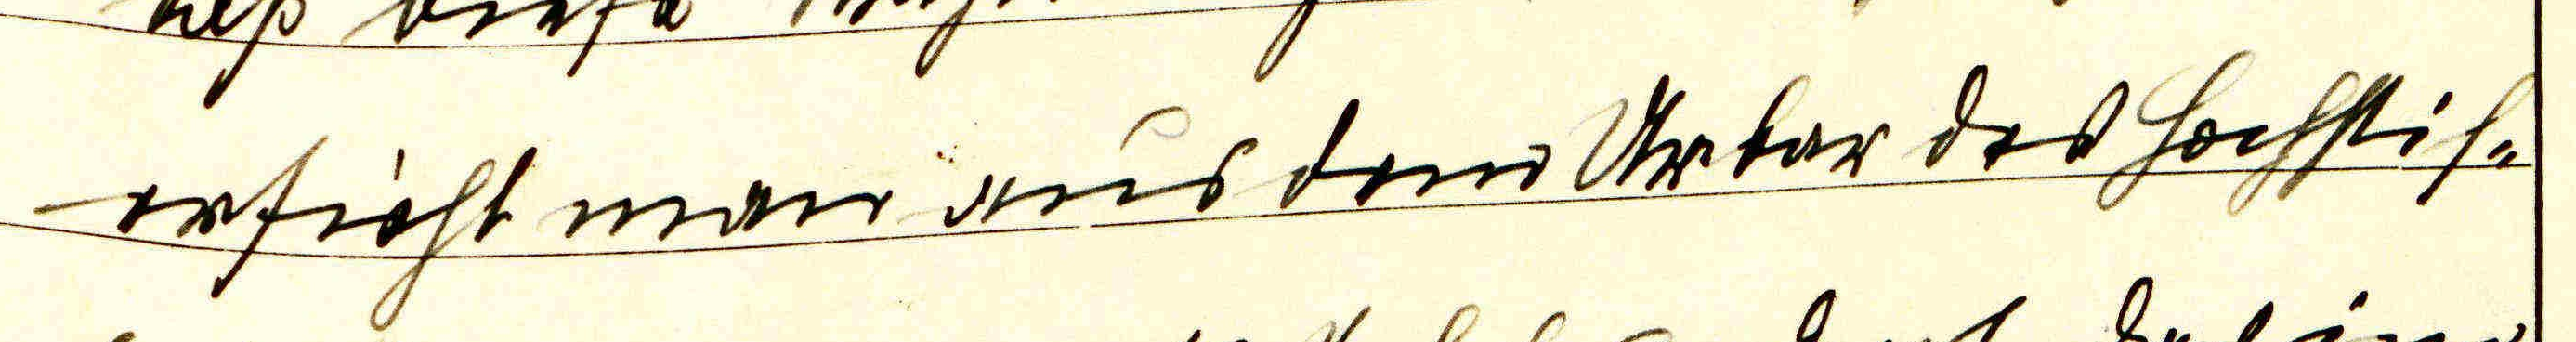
ersieht man aus dem Urbar des Hochstif-
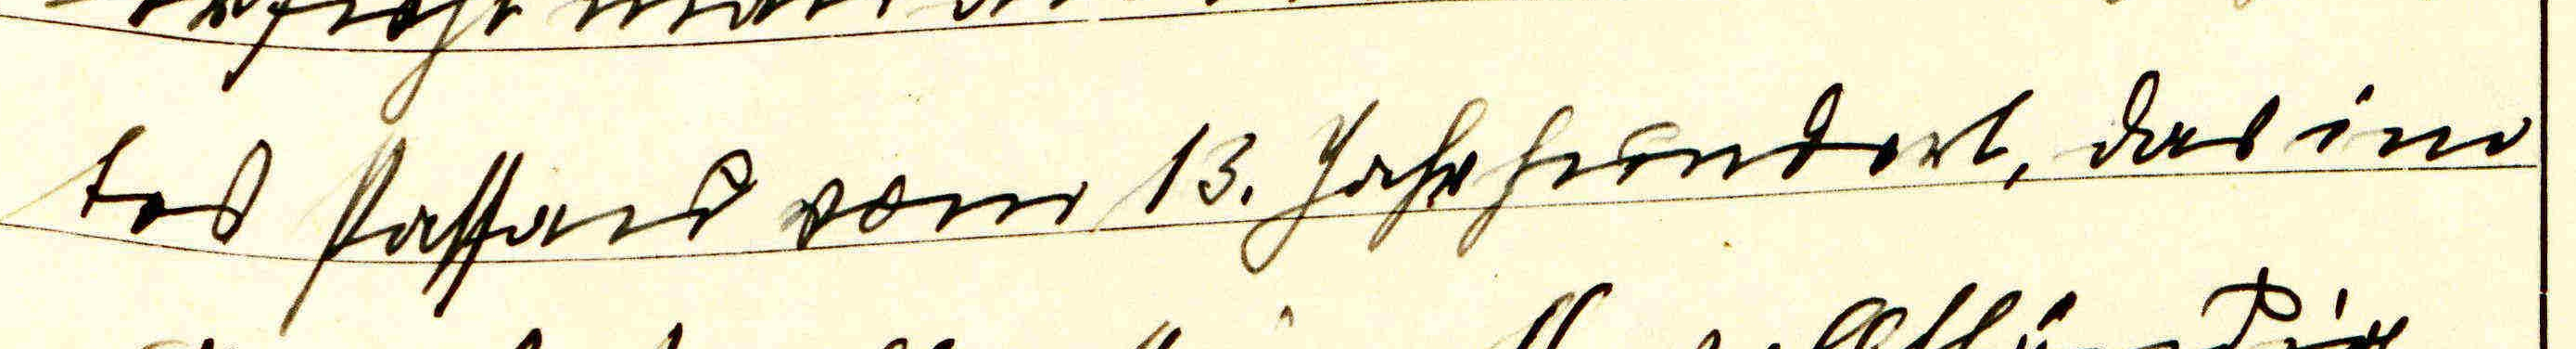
tes Passau vom 13. Jahrhundert, das im
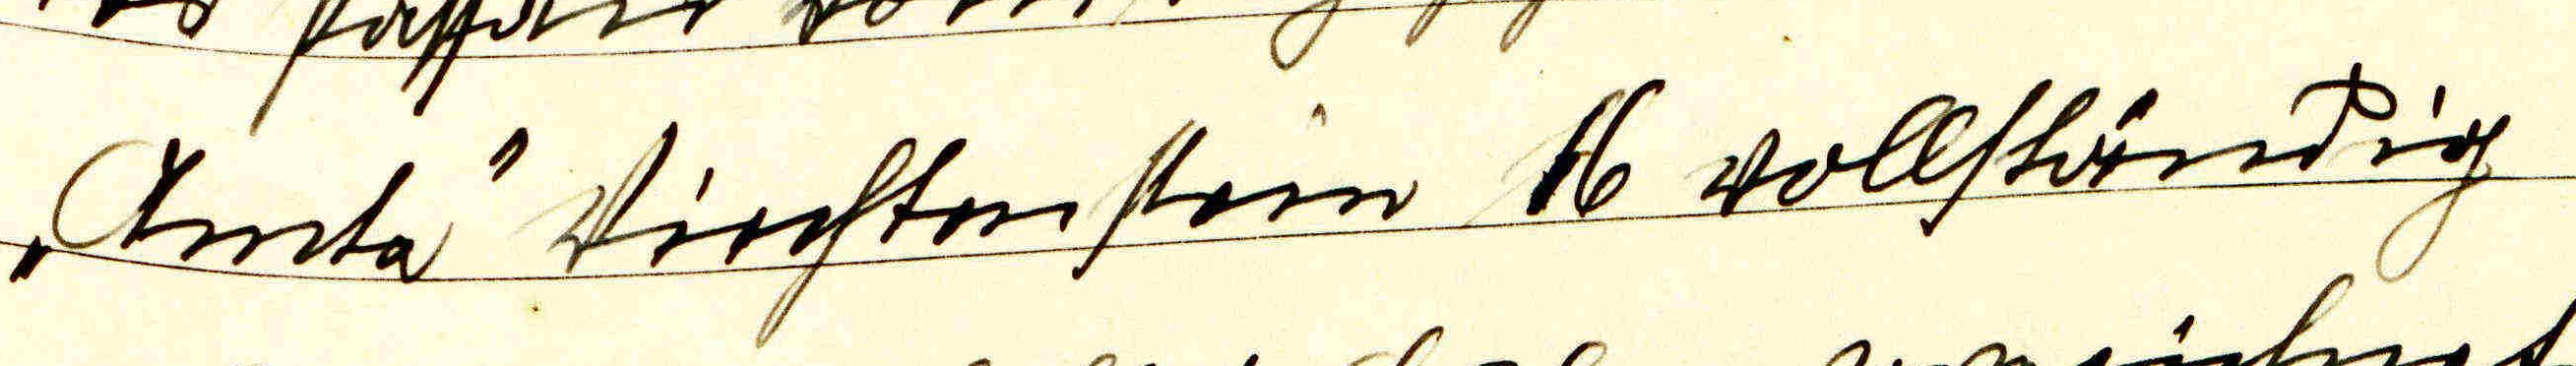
"Amte" Viechtenstein 16 vollständig
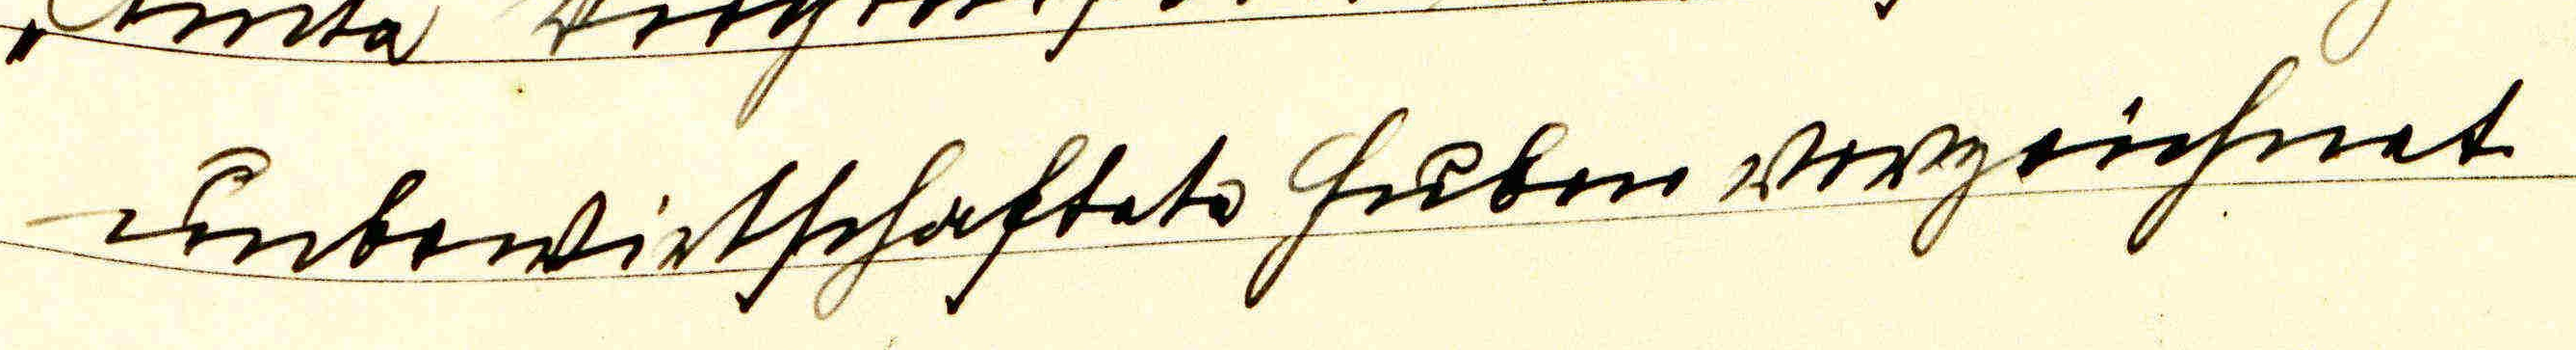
unbewirtschaftete Huben verzeichnet.
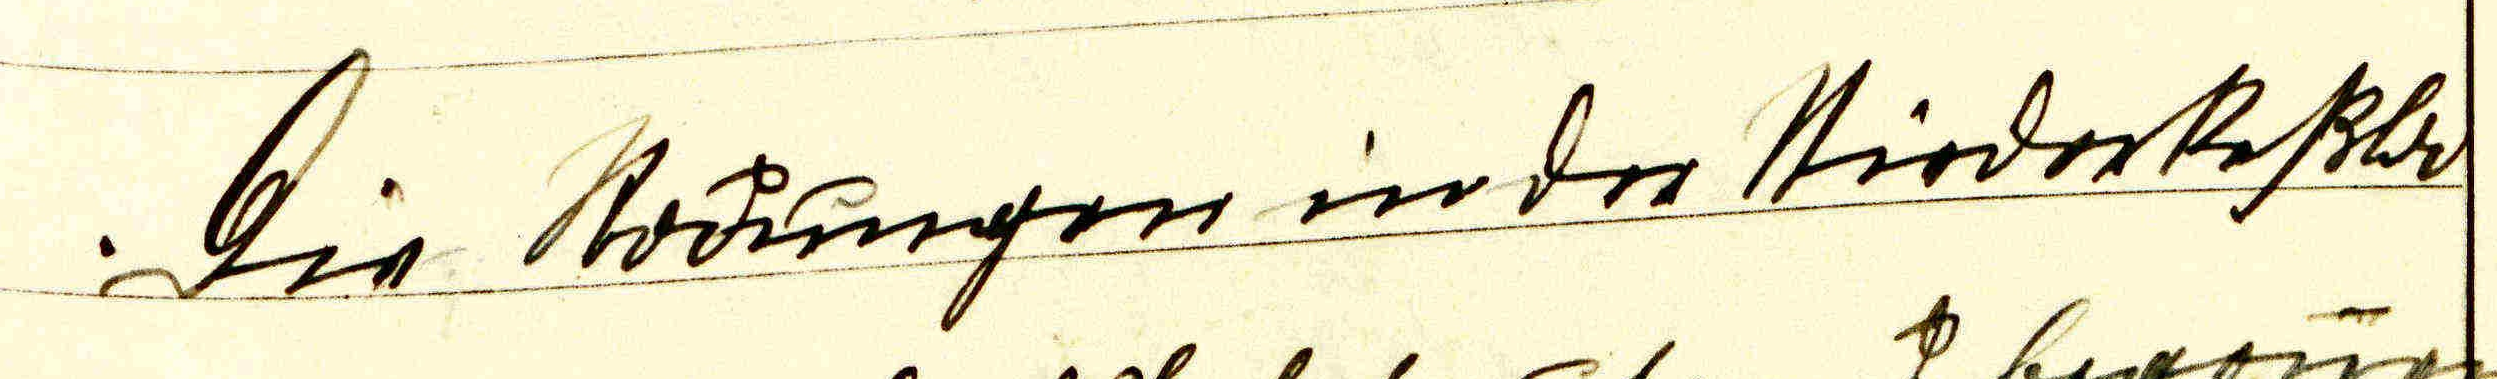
Die Rodungen in der Niederkeßla
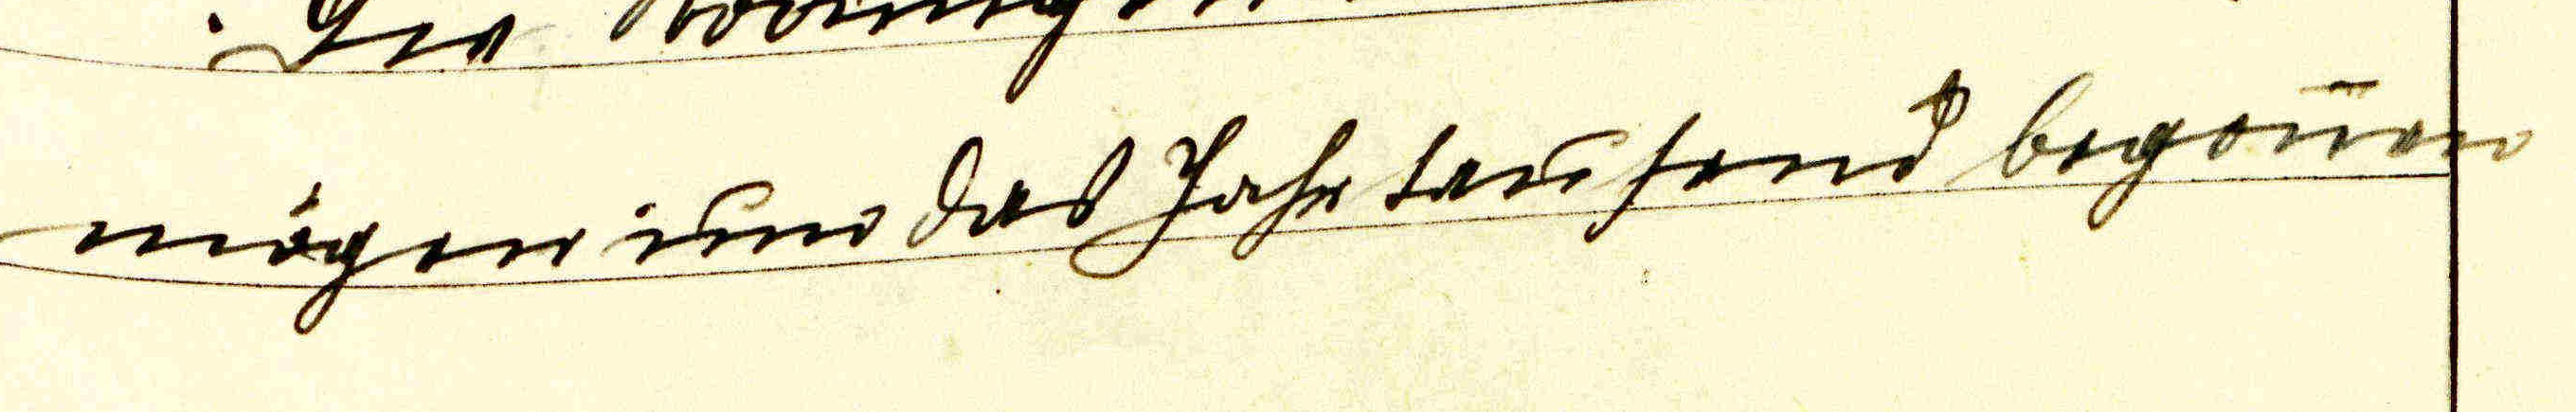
mögen um das Jahr tausend begonnen
